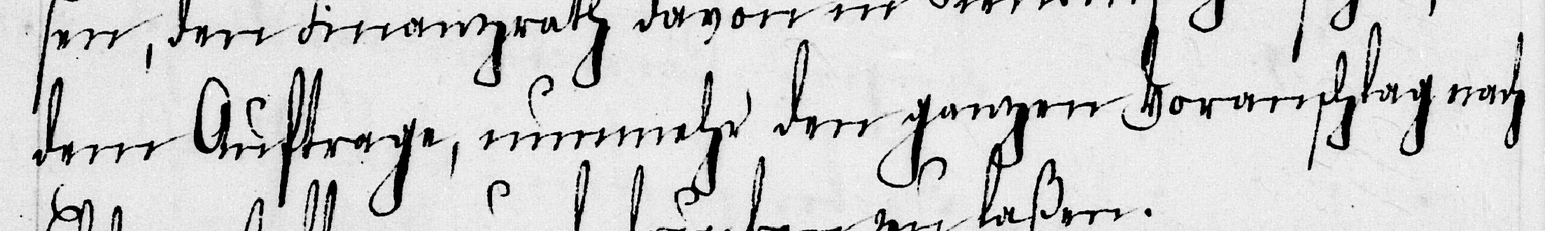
dem Auftrage, nunmehr den ganzen Voranschlag nach
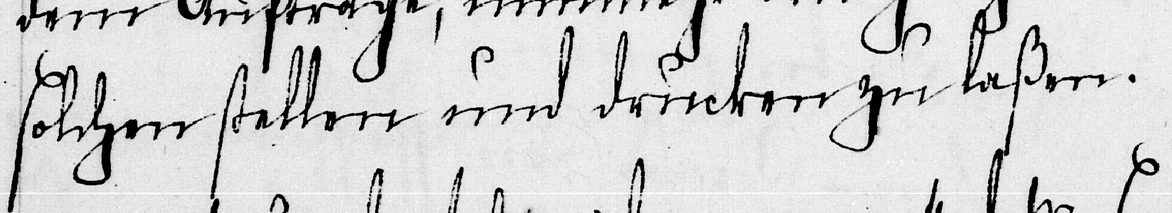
solchen stellen und drucken zu laßen.
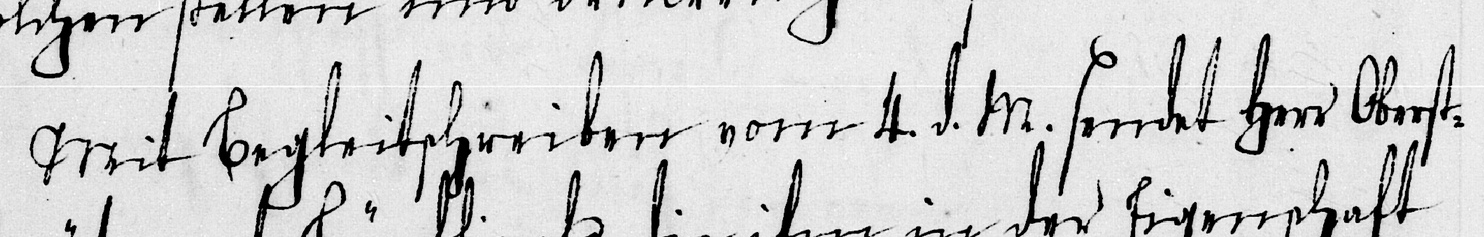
Mit Begleitschreiben vom 4. d. M. sendet Herr Obe¬
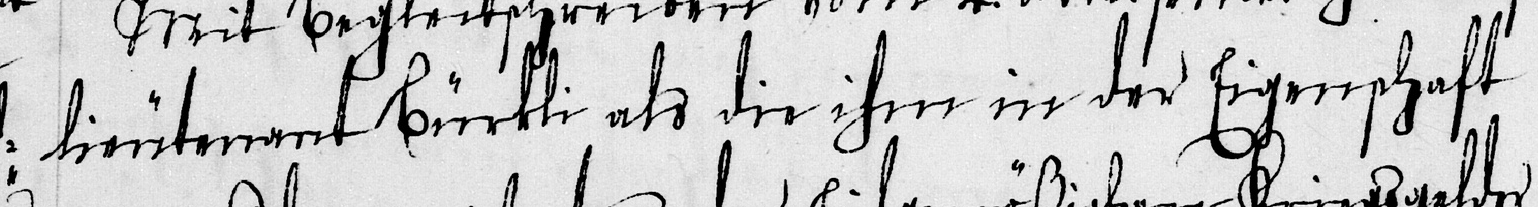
lieutenant Bürkli als die ihm in der Eigenschaft
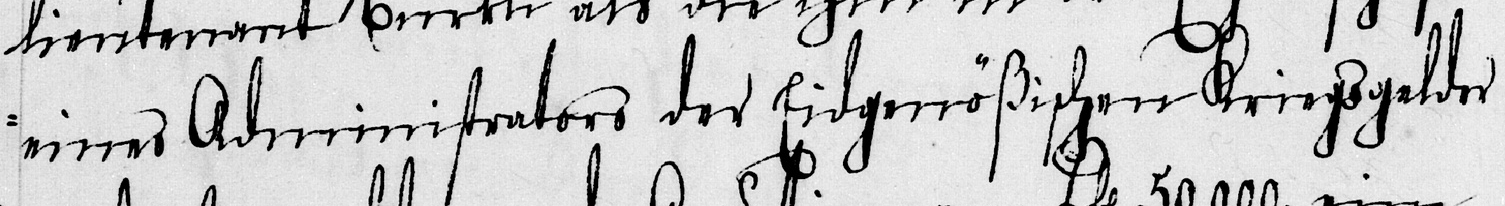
eines Administrators der Eidgenößischen Kriegsgelder
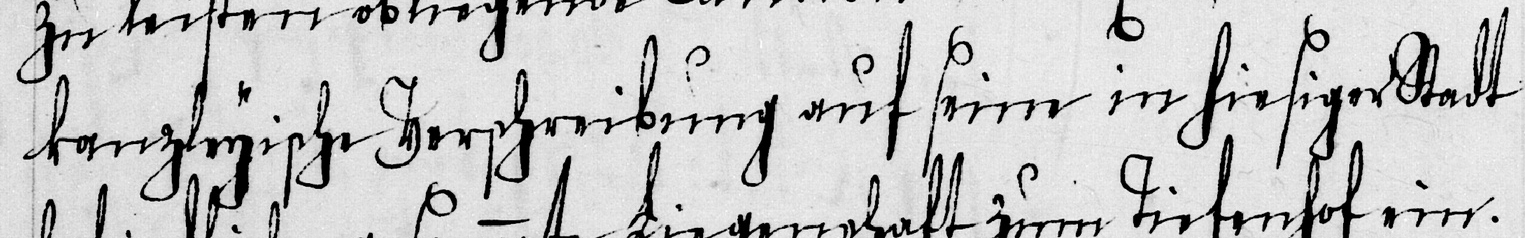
kanzleyische Verschreibung auf seine in hiesiger Stadt
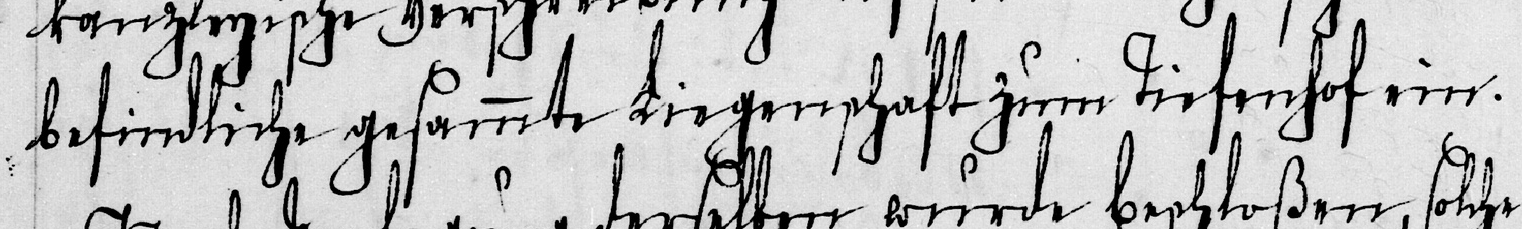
befindliche gesammte Liegenschaft zum Tiefenhof ein.
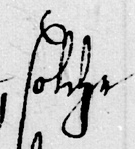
olche
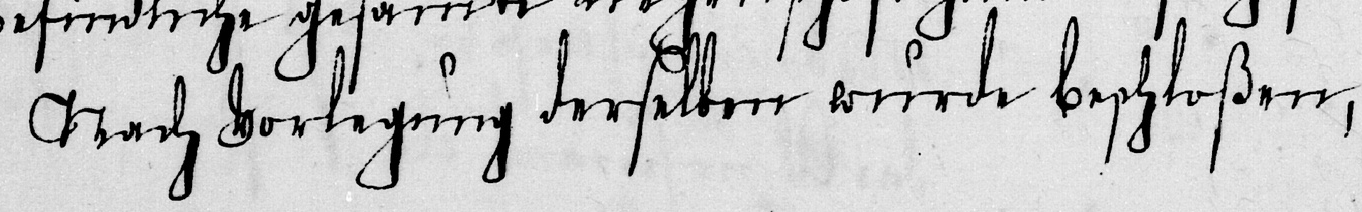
Nach Vorlegung derselben wurde beschloßen,
